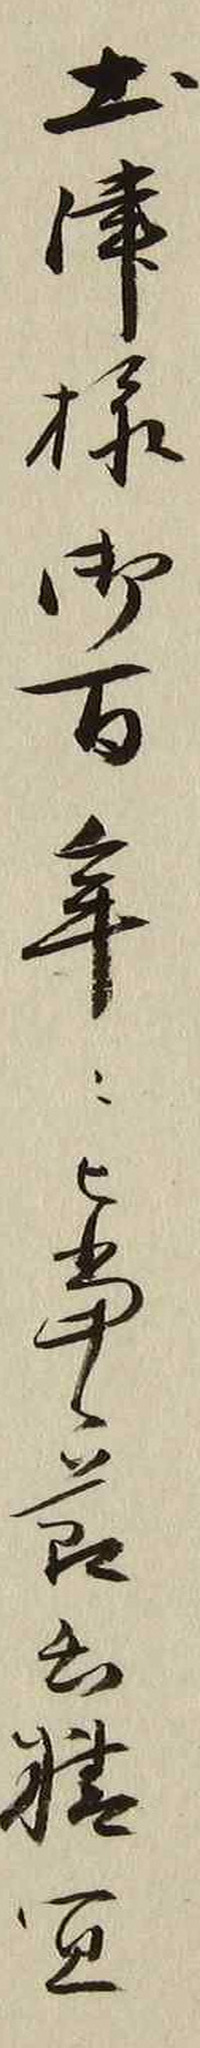土津様御百年ニ被当候節出精宜
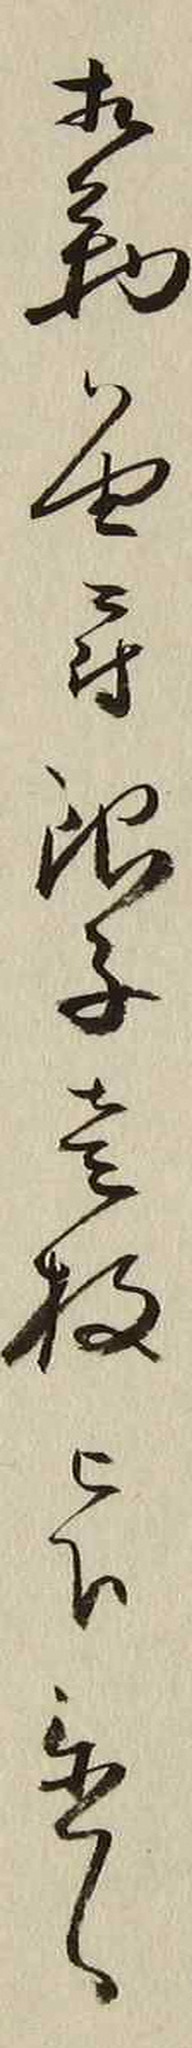相勤候由ニ付銀子壱枚被下置候
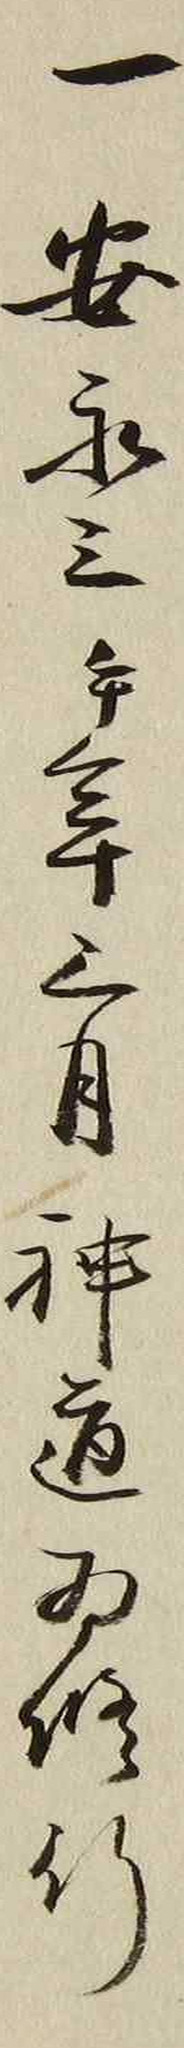一安永三午年三月神道為修行
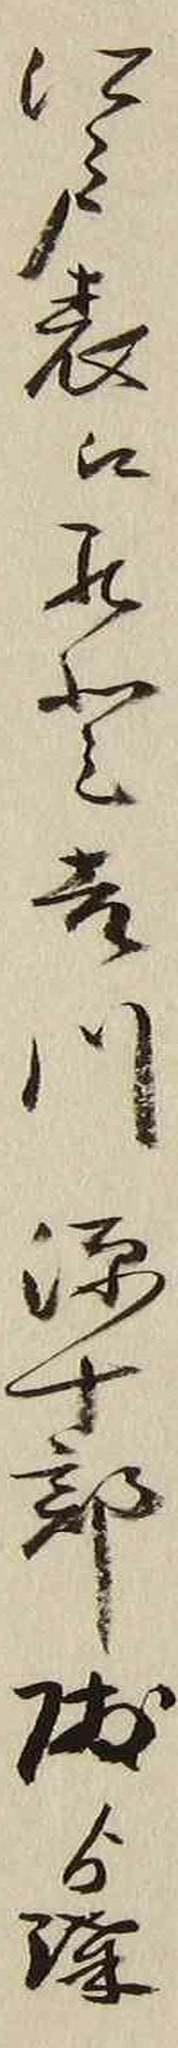江戸表江罷登吉川源十郎殿ゟ講
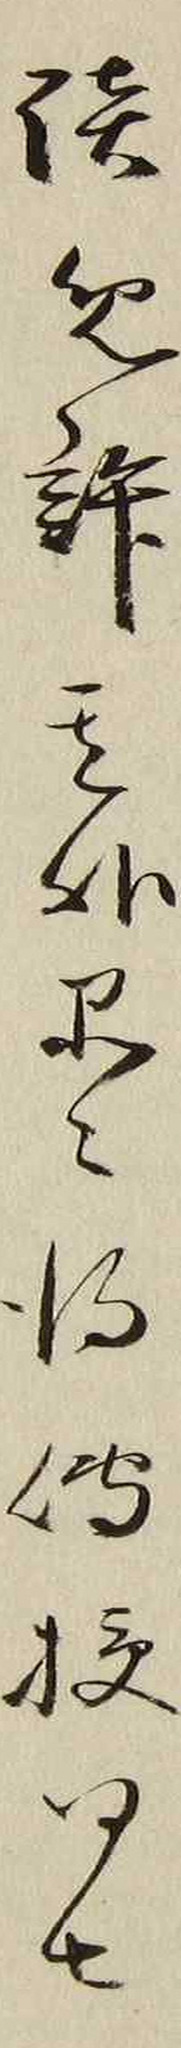談免許其外品々得伝授同七
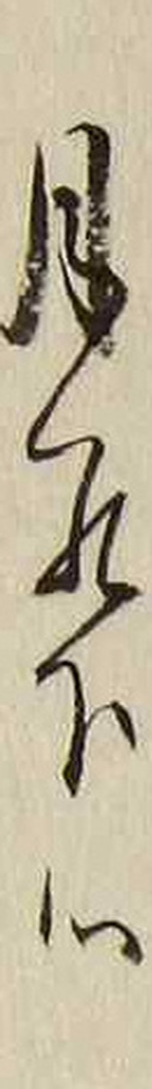月罷下候
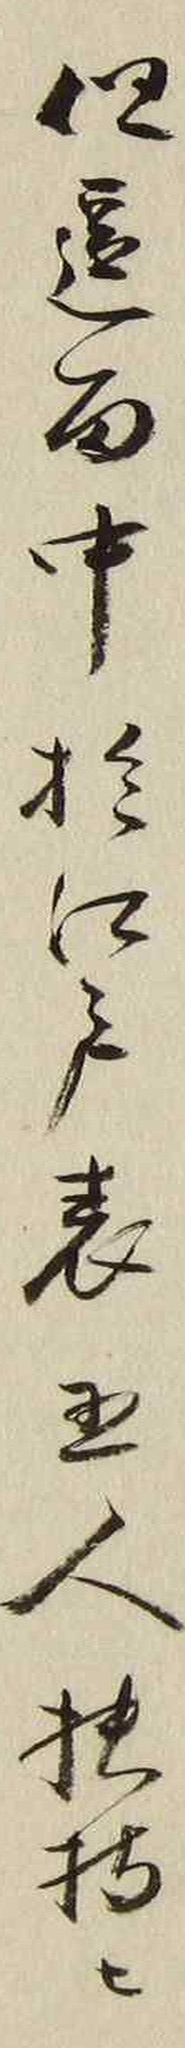但逗留中於江戸表五人扶持被
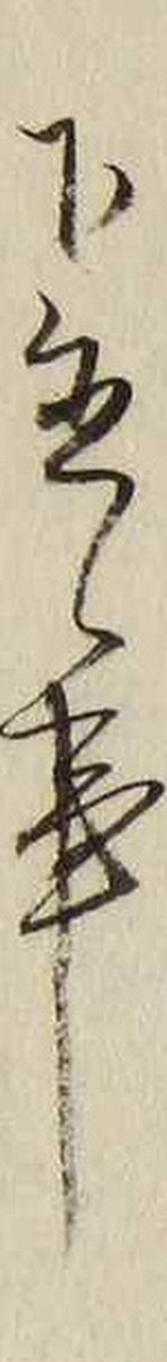下置候事
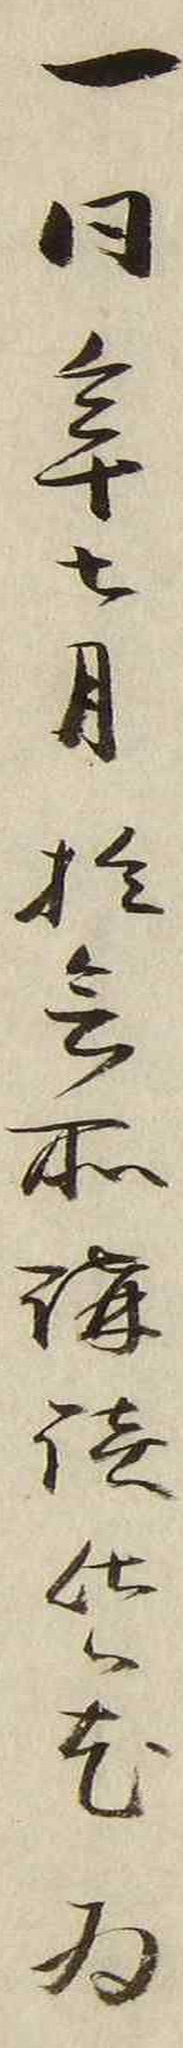一同年七月於会所講談仕候尤為

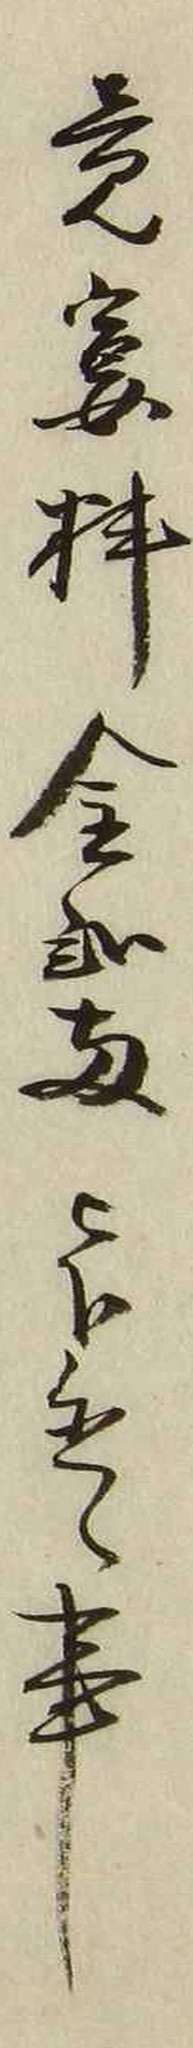竟宴料金弐両被下置候事
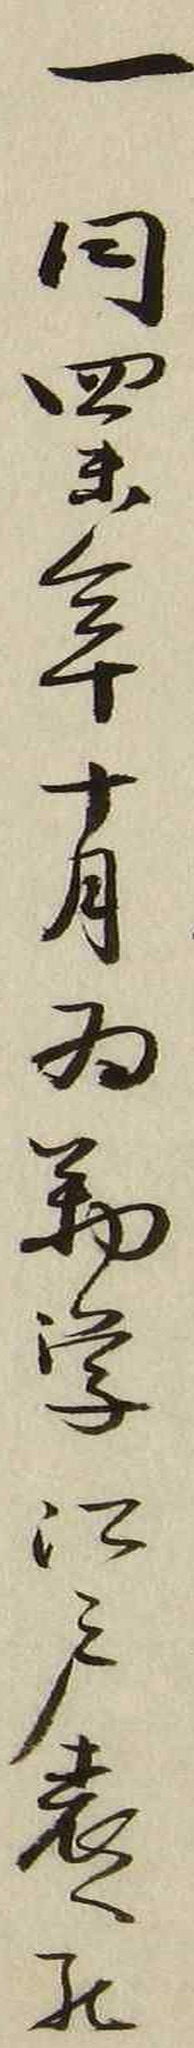一同四未年十月為勤学江戸表へ罷
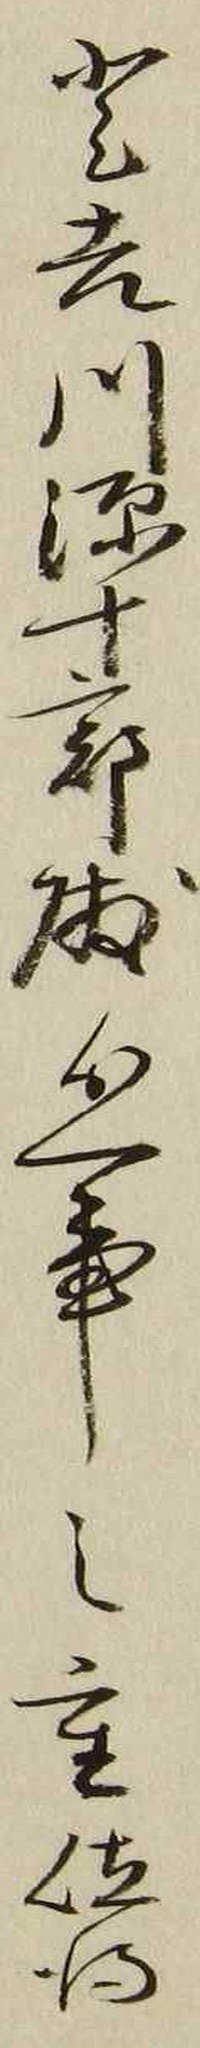登吉川源十郎殿ゟ一事之重位得
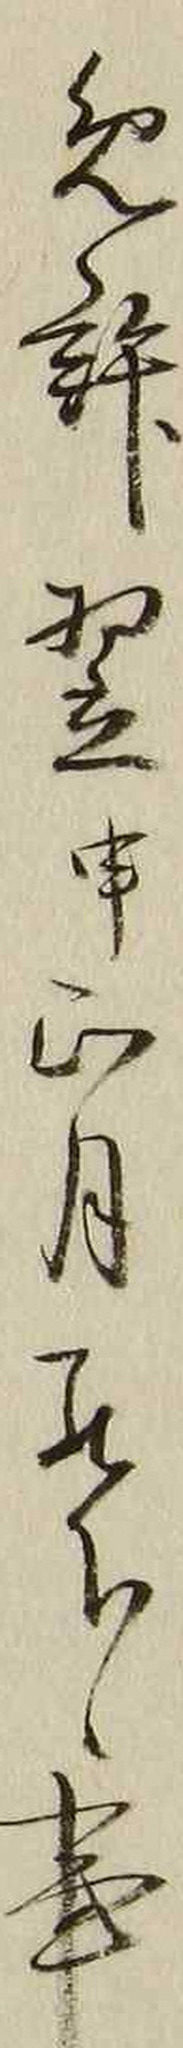免許翌申正月罷下候事
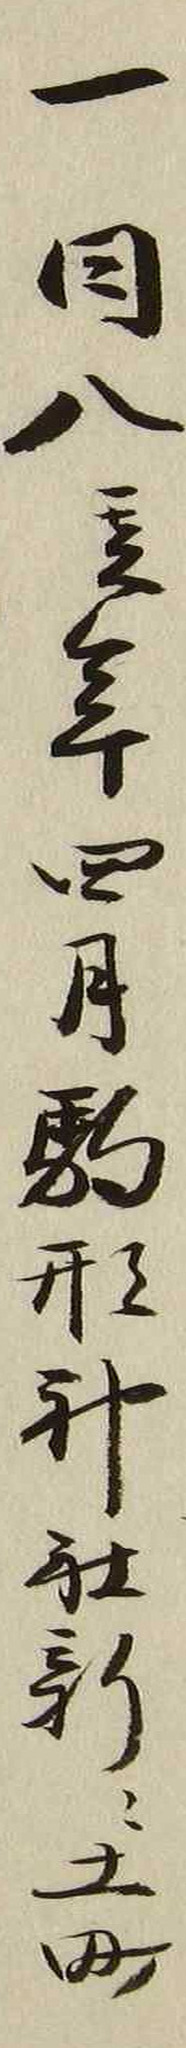一同八亥年四月駒形神社新ニ土町
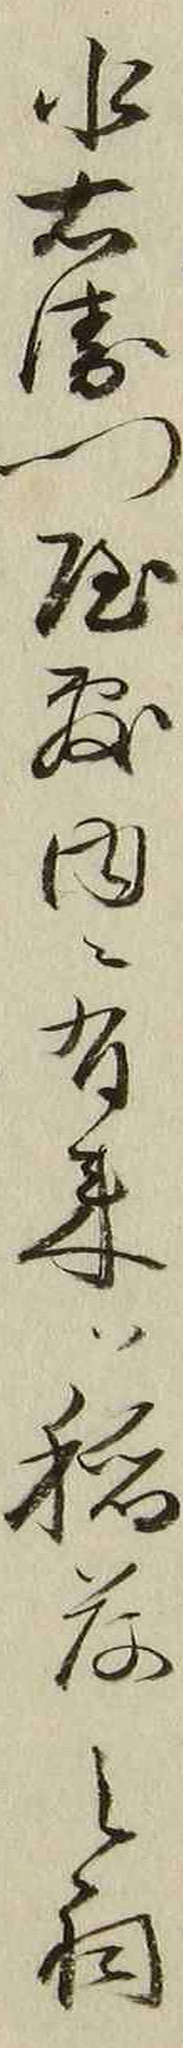水右衛門屋敷内ニ有来候稲荷之祠
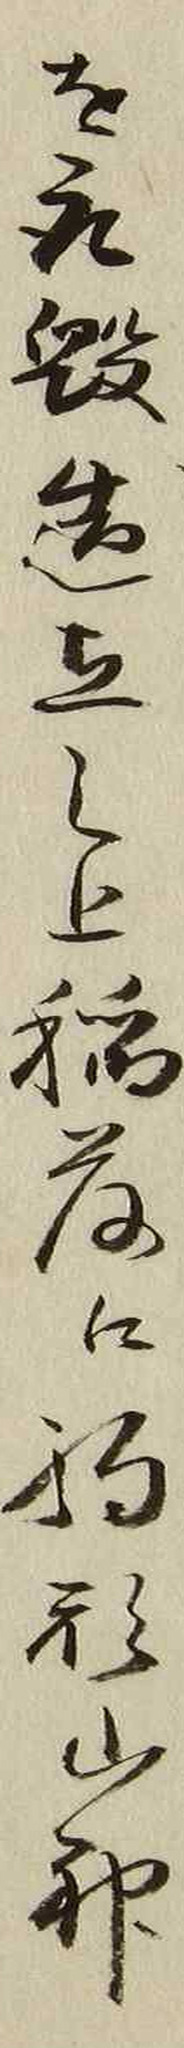を取毀造立之上稲荷江駒形山神
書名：諸士系譜　巻之291　さ之部23
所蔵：会津若松市立会津図書館
